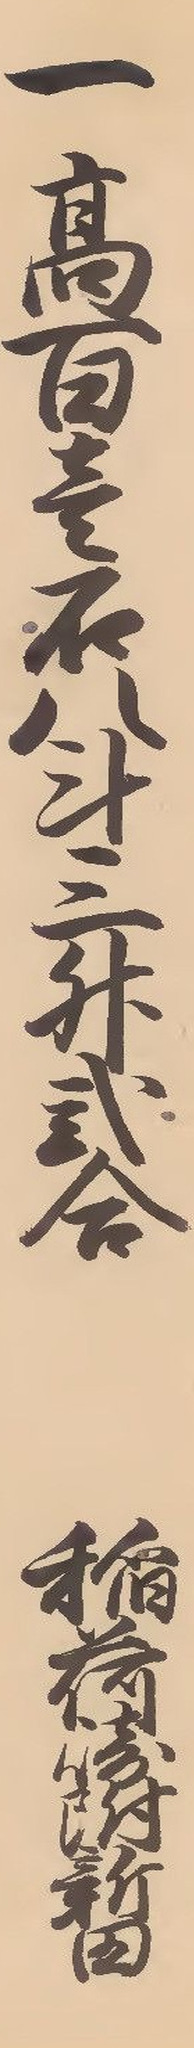一高百壱石八斗三升弐合稲荷崎附新田
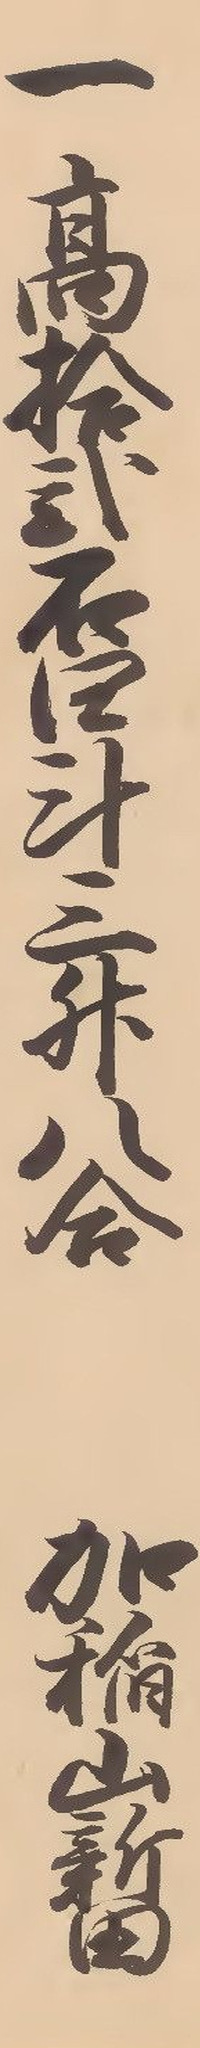一高拾弐石四斗三升八合加稲山新田
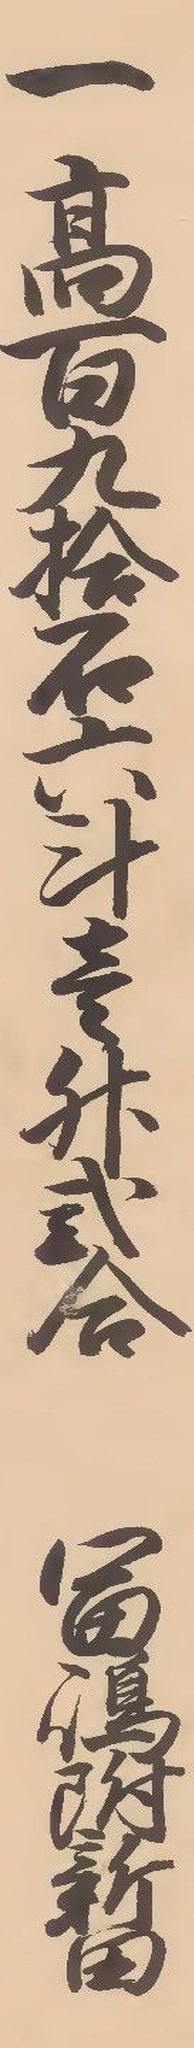一高百九拾石六斗壱升弐合富嶋附新田
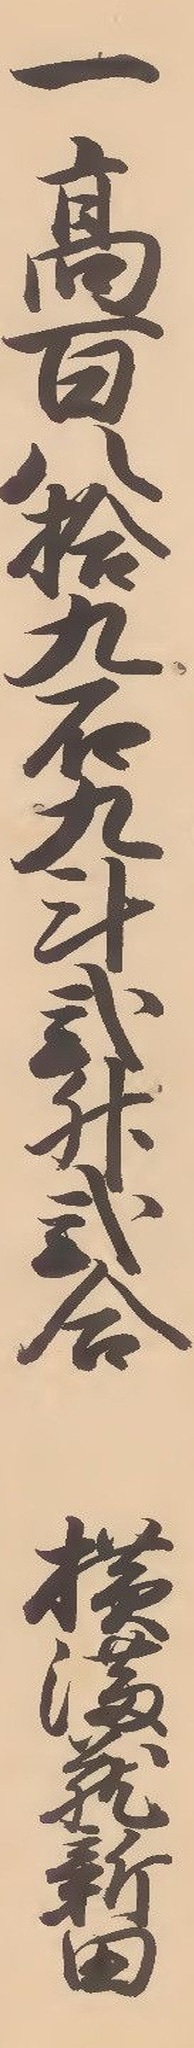一高百八拾九石九斗弐升弐合横満蔵新田
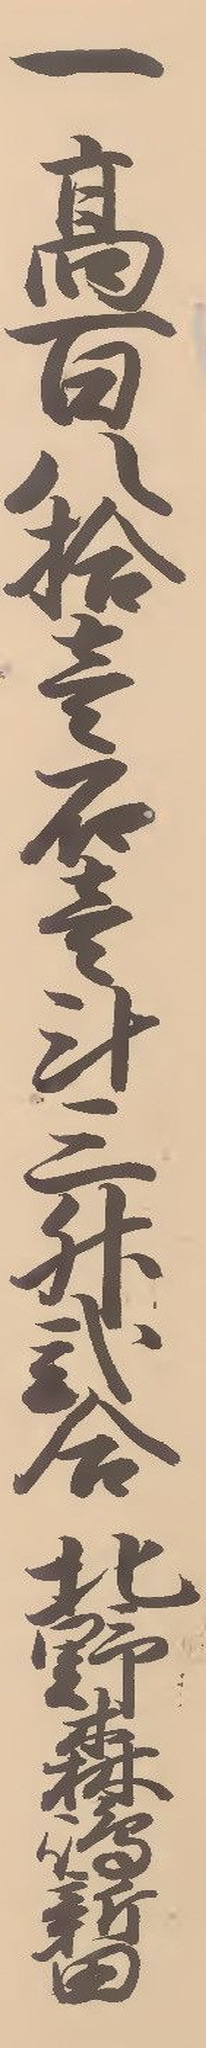一高百八拾壱石壱斗三升弐合北野森嶋新田
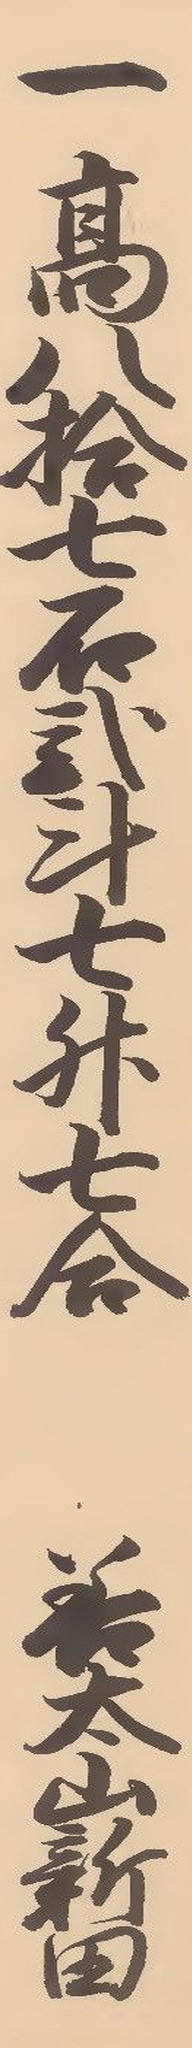一高八拾七石弐斗七升七合善太山新田
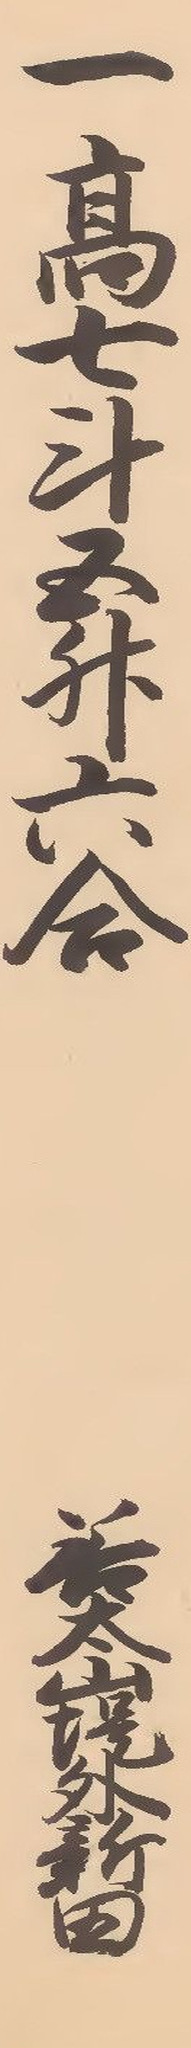一高七斗五升六合善太山堤外新田
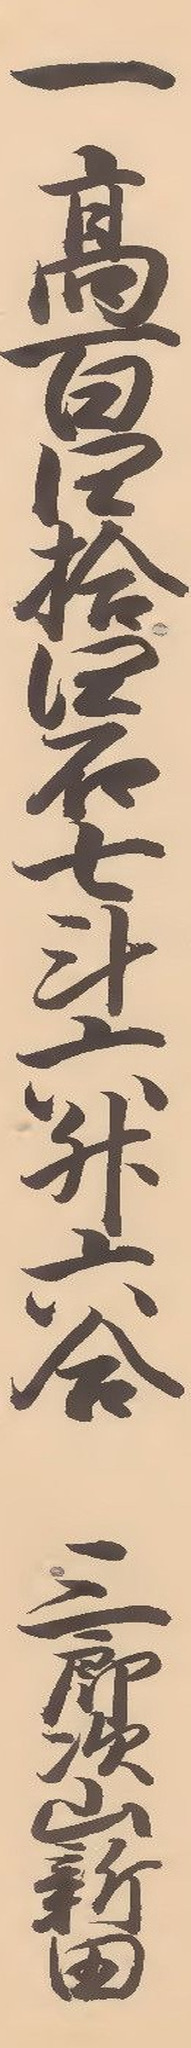一高百四拾四石七斗六升六合三郎次山新田

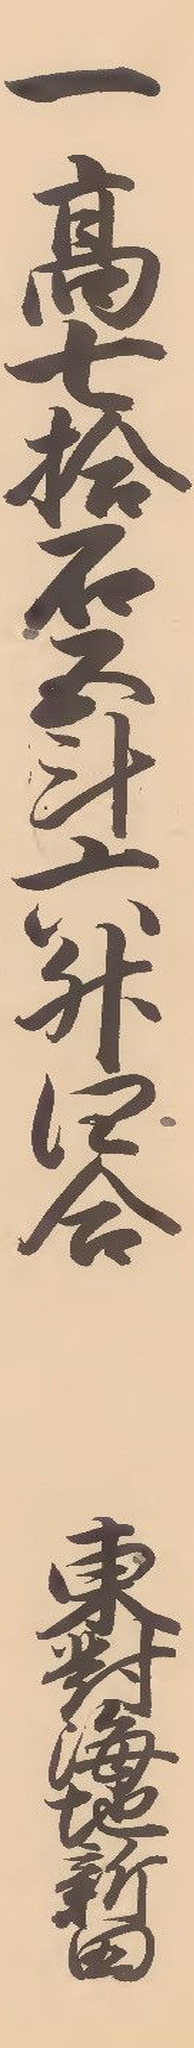一高七拾石五斗六升四合東対海地新田
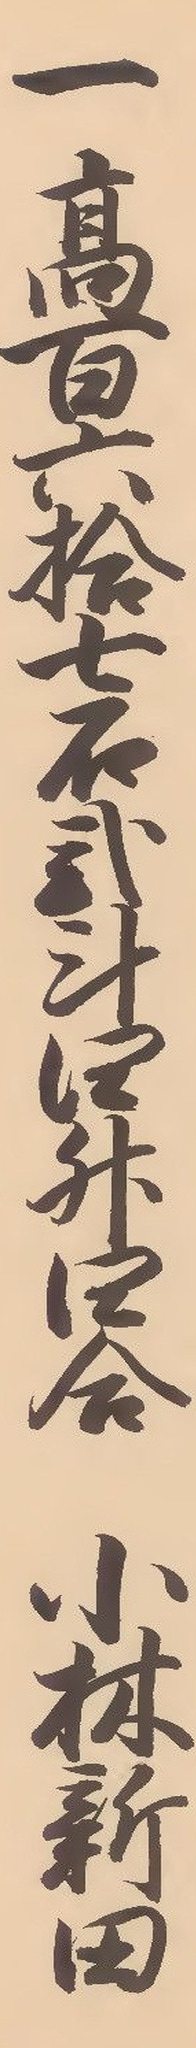一高百六拾七石弐斗四升四合小林新田
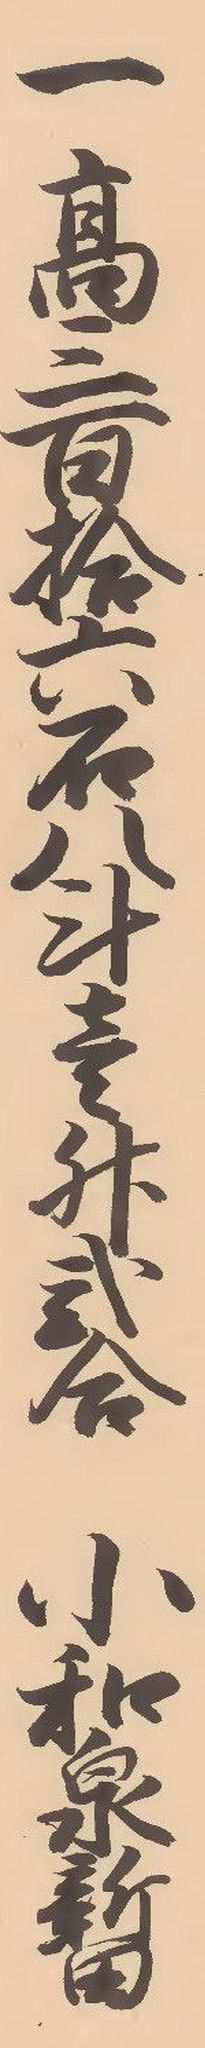一高三百拾六石八斗壱升弐合小和泉新田
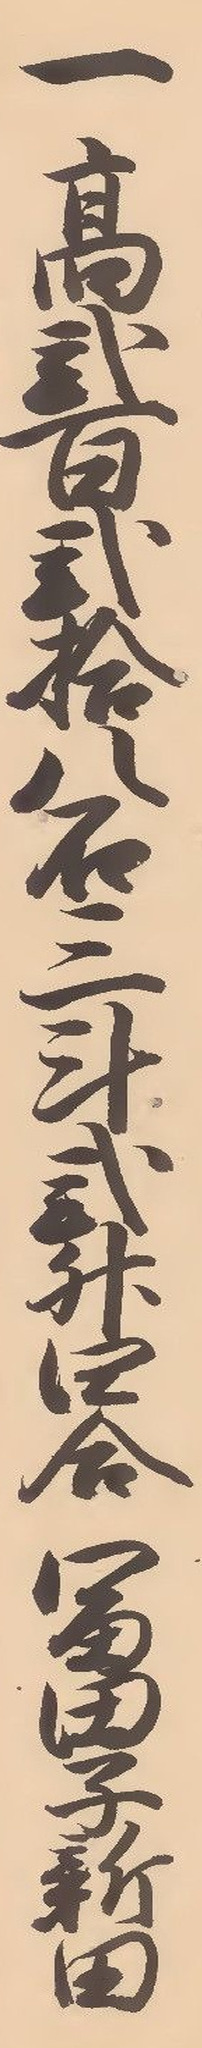一高弐百弐拾八石三斗弐升四合富田子新田
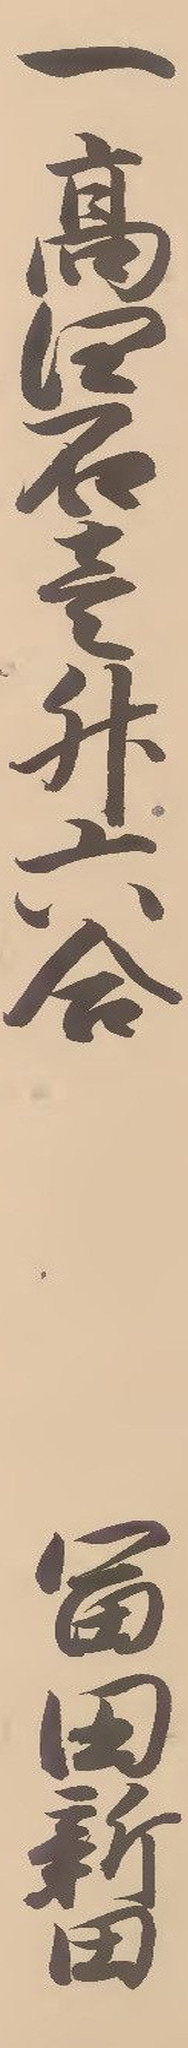一高四石壱升六合富田新田
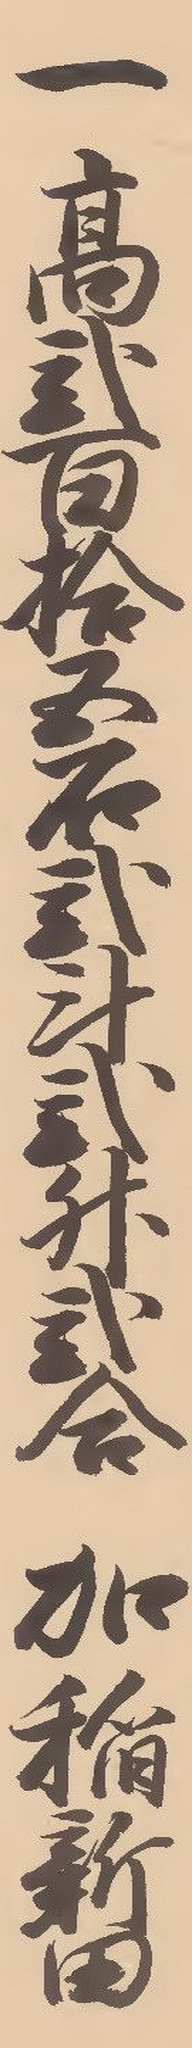一高弐百拾五石弐斗弐升弐合加稲新田
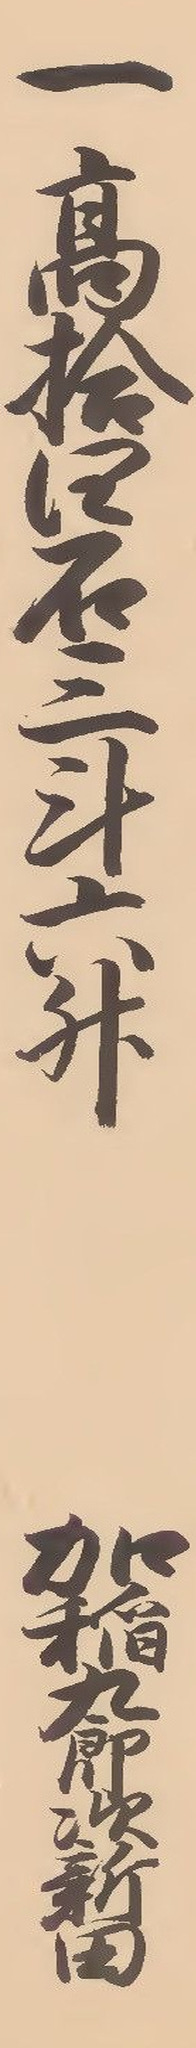一高拾四石三斗六升加稲九郎次新田
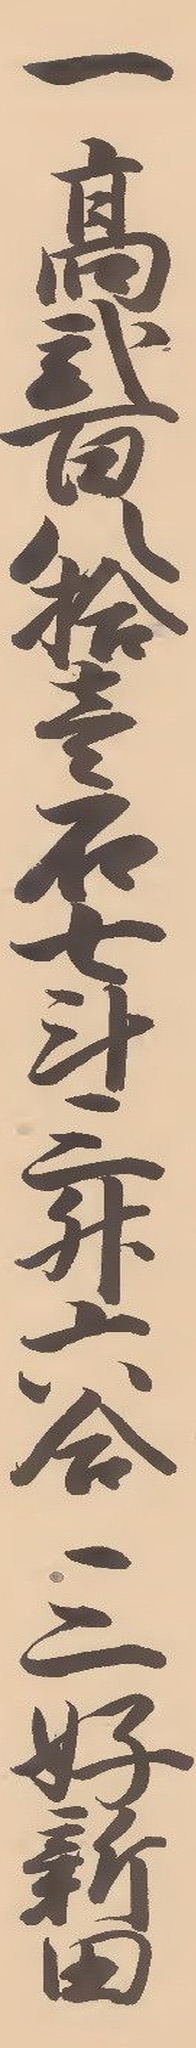一高弐百八拾壱石七斗三升六合三好新田
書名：伊勢国郷帳
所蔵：国立公文書館 National Archives of Japan
